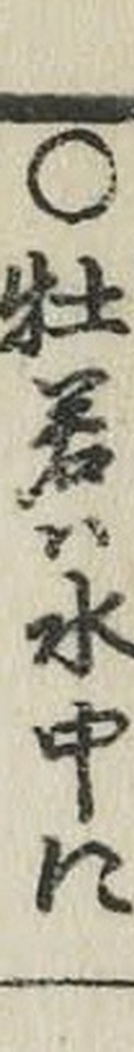○杜若は水中に
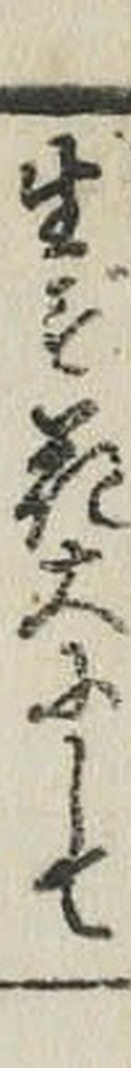生ず花大にして
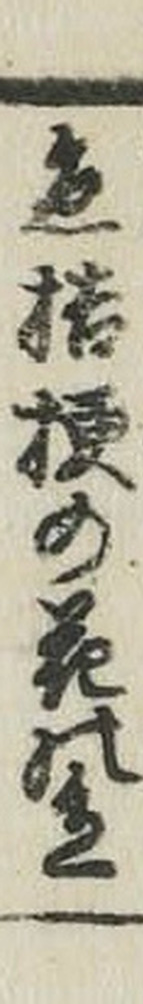色桔梗の花の色
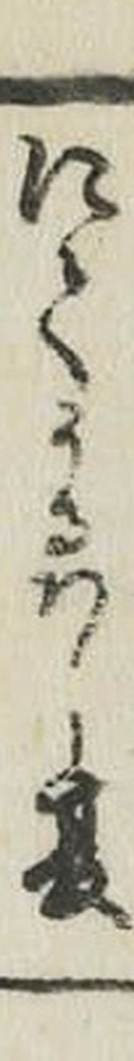にてうるはし夏
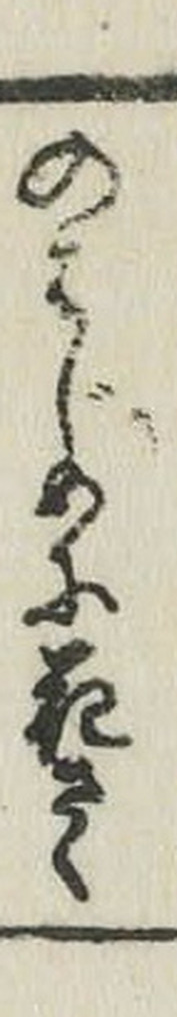のはじめに花さく
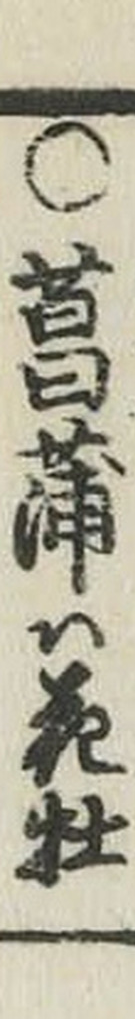○菖蒲は花杜
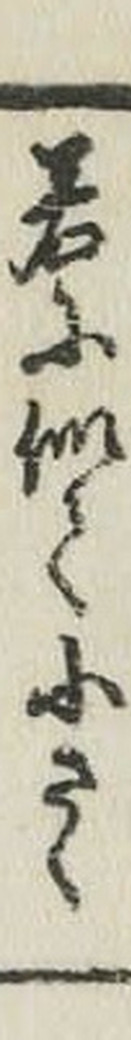若に似て小さく
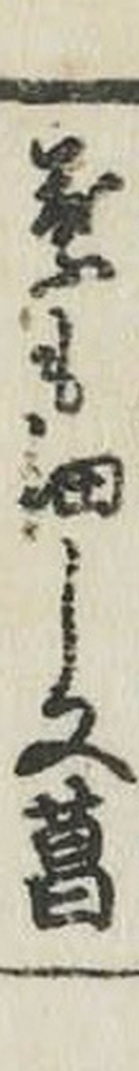葉も細し又菖
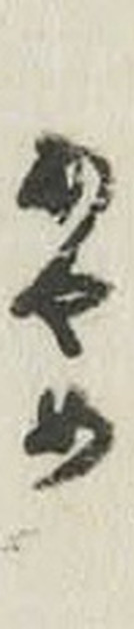あやめ
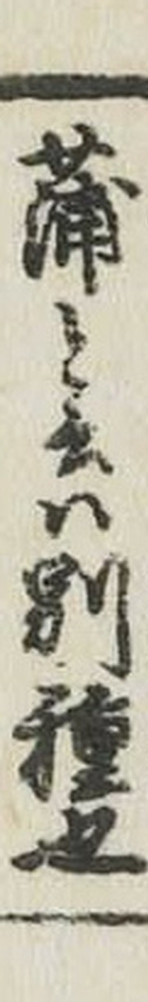蒲と云は別種也
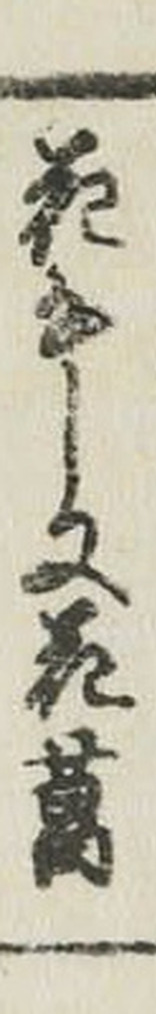花なし又花菖
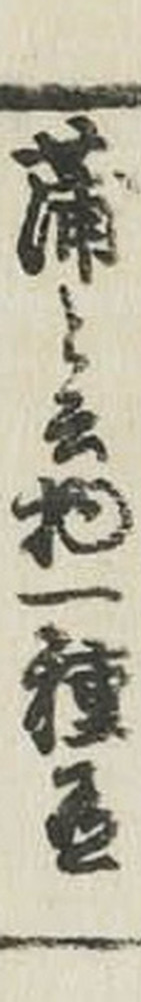蒲と云物一種有
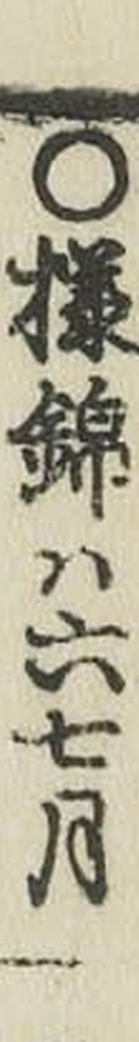○様錦は六七月
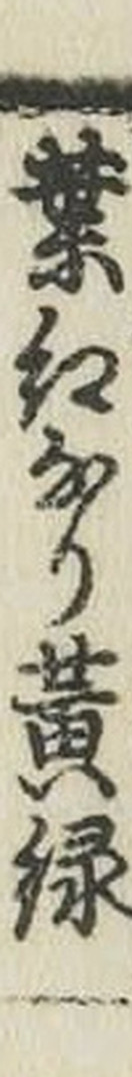葉紅なり黄緑
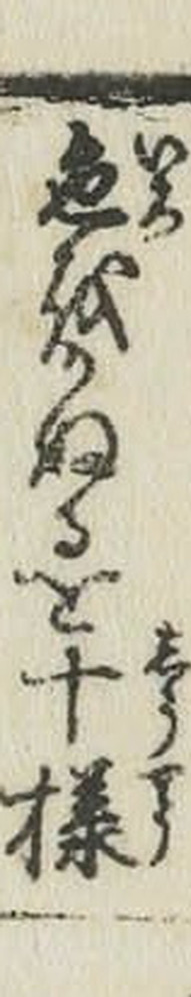色をかぬるを十様
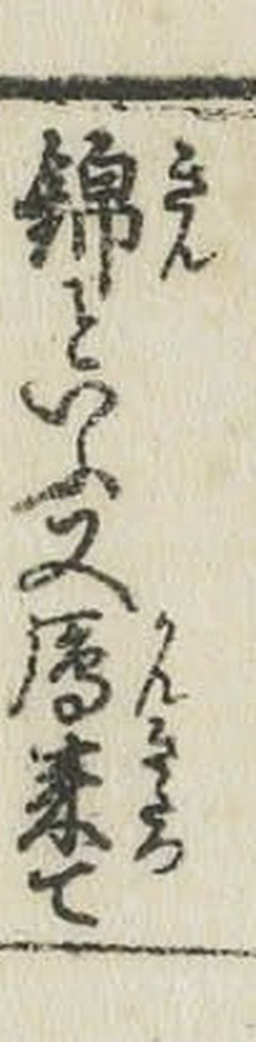錦といふ又雁来て
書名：増補頭書訓蒙図彙大成 10巻 9:巻之20
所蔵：東京学芸大学教育コンテンツアーカイブ
